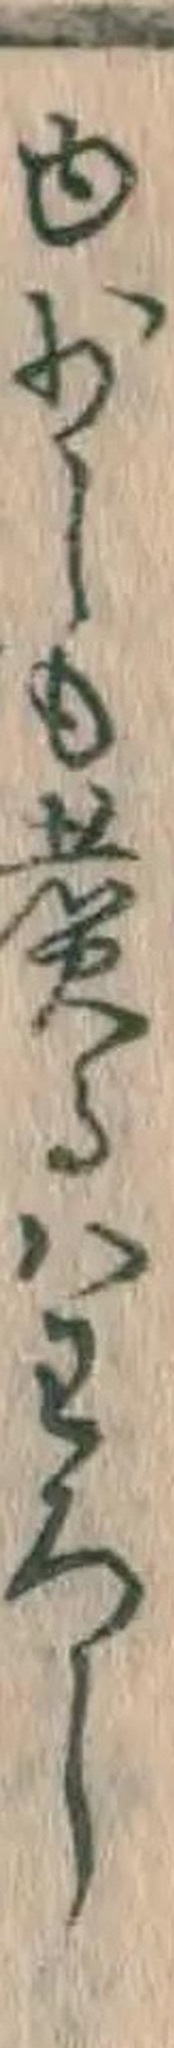ゆ少しも煮るはわろし
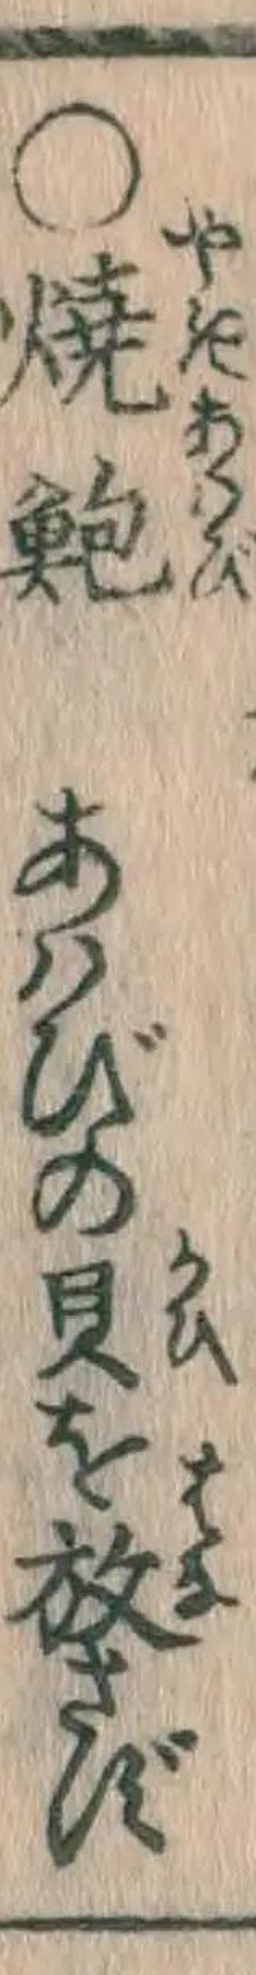○焼鮑あはびの貝を放さず
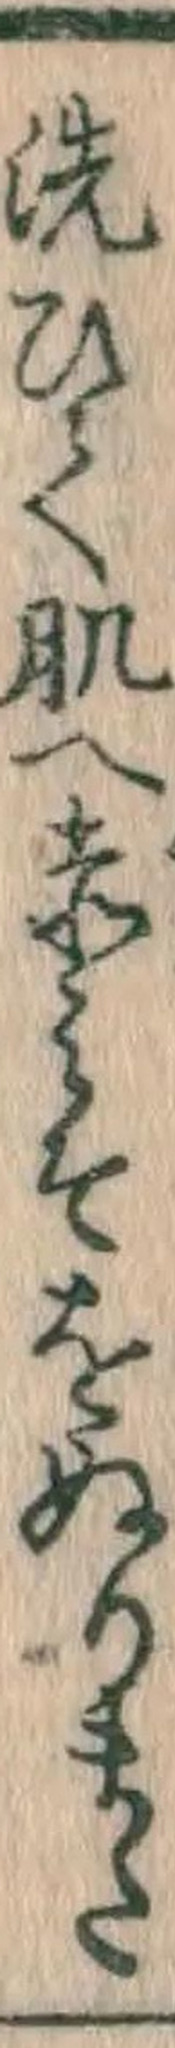洗ひて肌へ赤みそをぬりまた
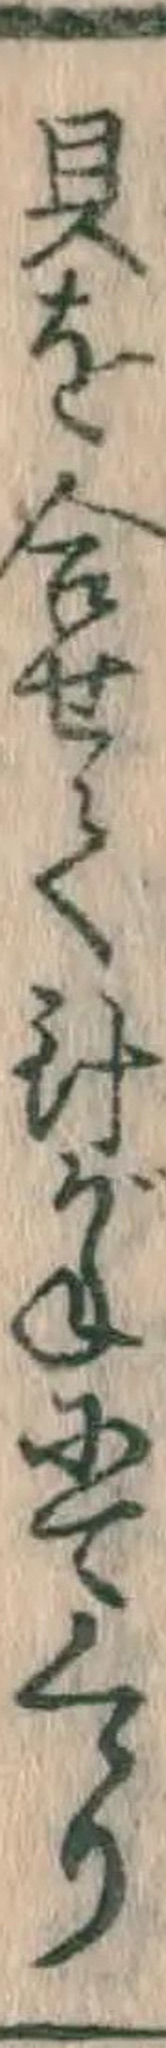貝を合せて針がねにてくゝり
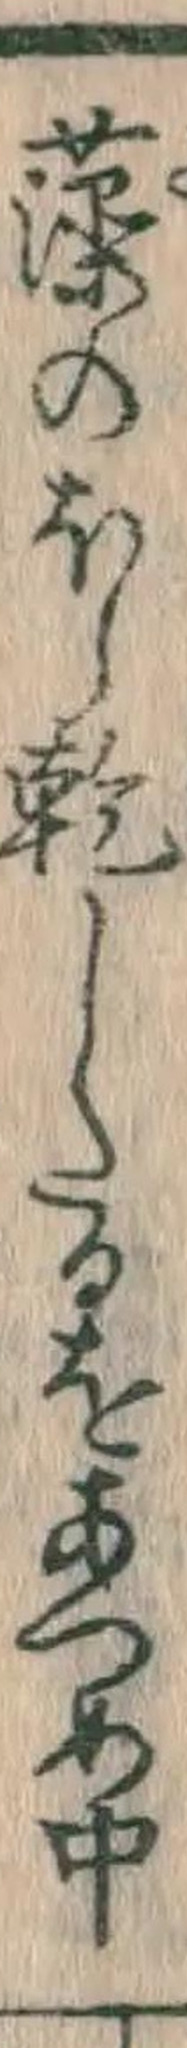藻のほし乾したるをあつめ中
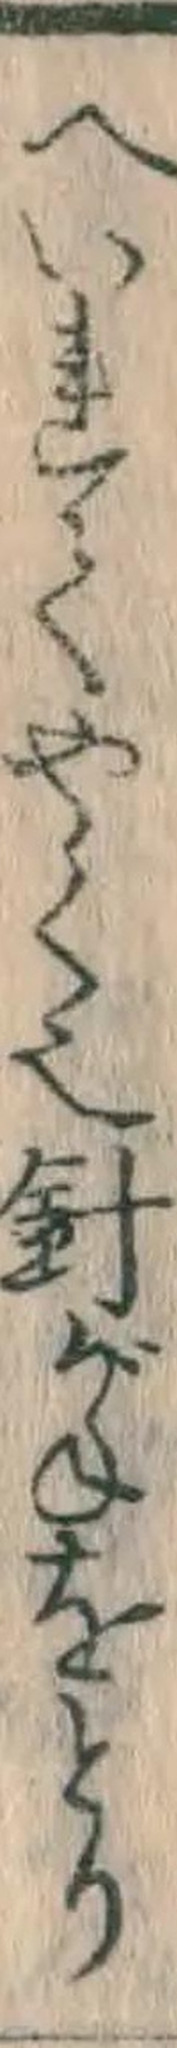へいれてやく也針がねをとり
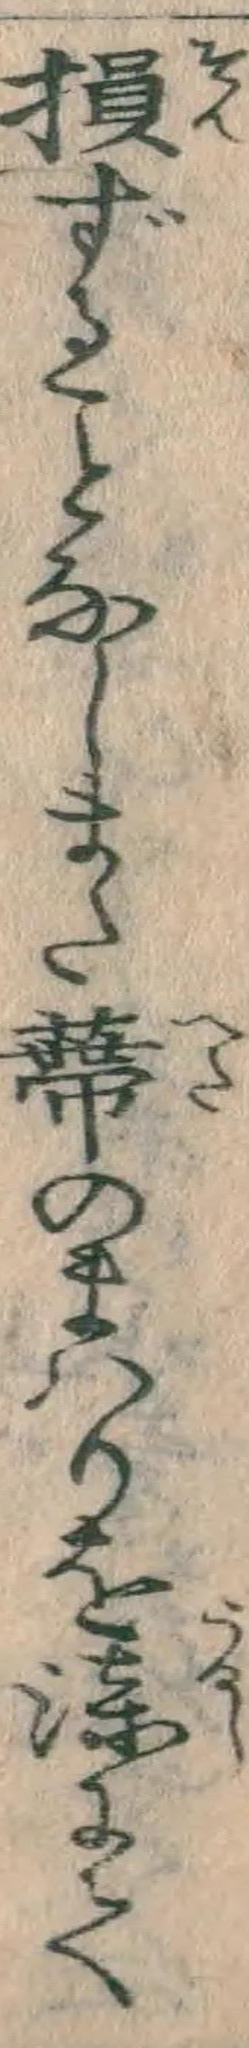損ずることなしまた蔕のまはりを漆にて
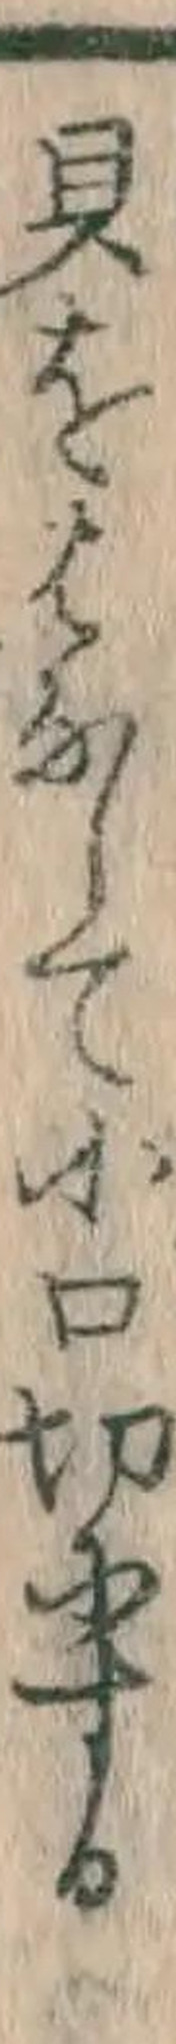貝をはなして小口切にする
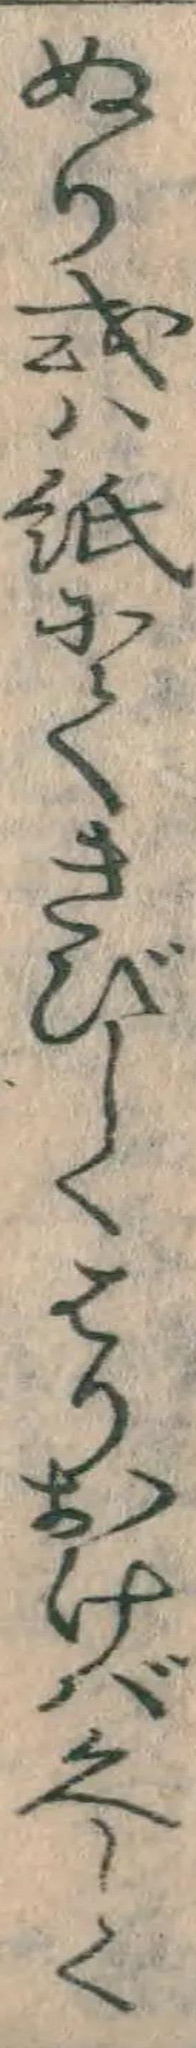ぬり或は紙にてきびしくはりおけば久しく
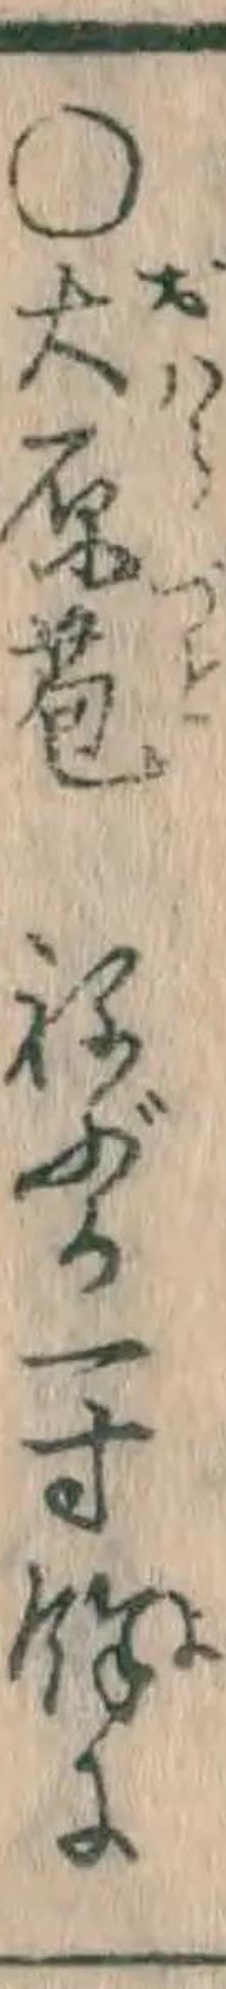○大原苞ねぶか一寸余に
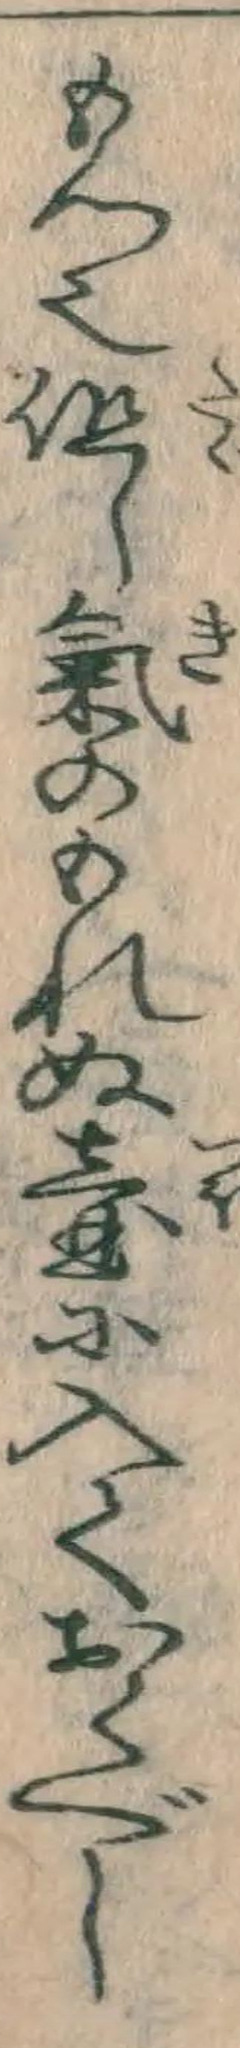もつ也但し気のもれぬ壺に入ておくべし
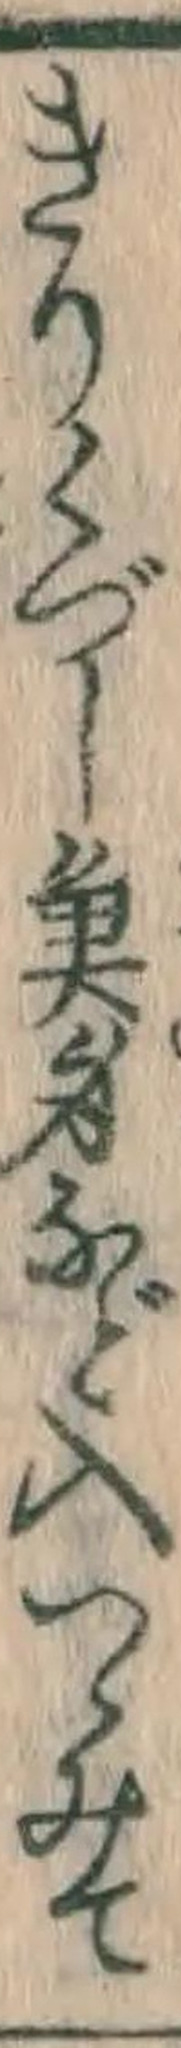きりくづし魚身など入つゝみて
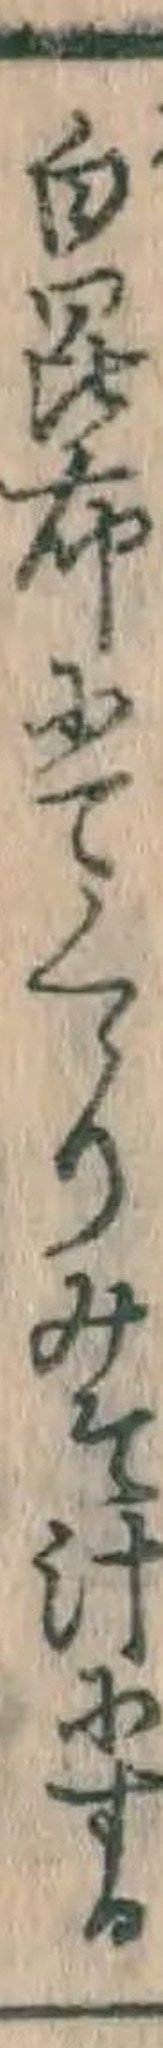白昆布にてくゝりみそ汁にする
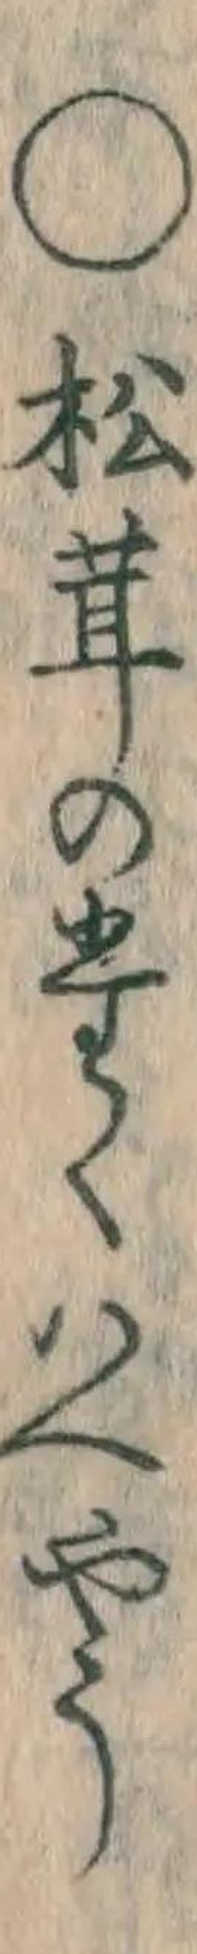○松茸のたくはへやう

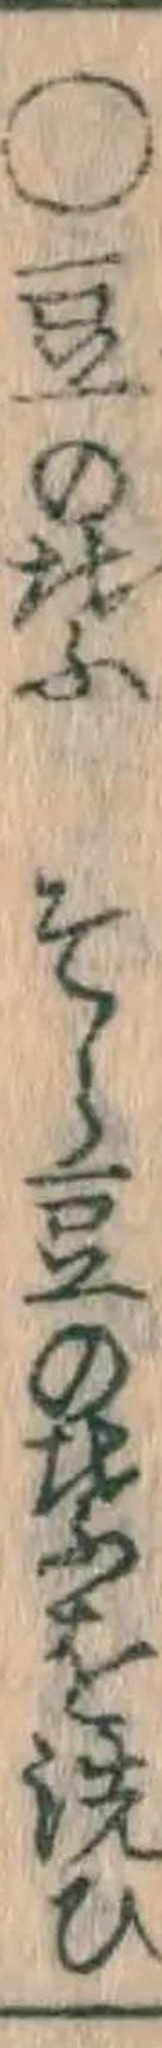○豆の葉そら豆の葉を洗ひ
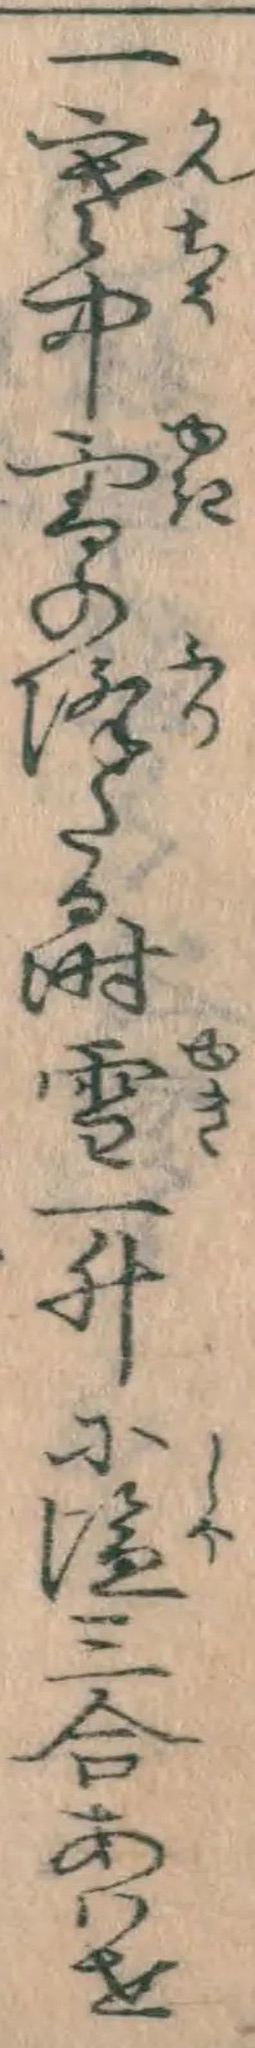一寒中雪の降たる時雪一升に塩三合あはせ
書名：広益秘事大全 3巻. [5]
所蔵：国立国会図書館 National Diet Library, JAPAN
